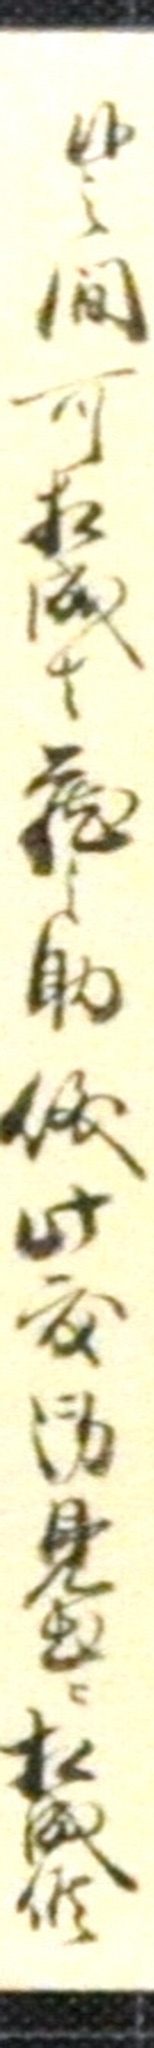候之間可相成は蔵之助儀此度御見出に相成候
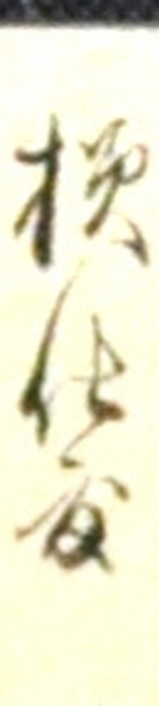様仕度
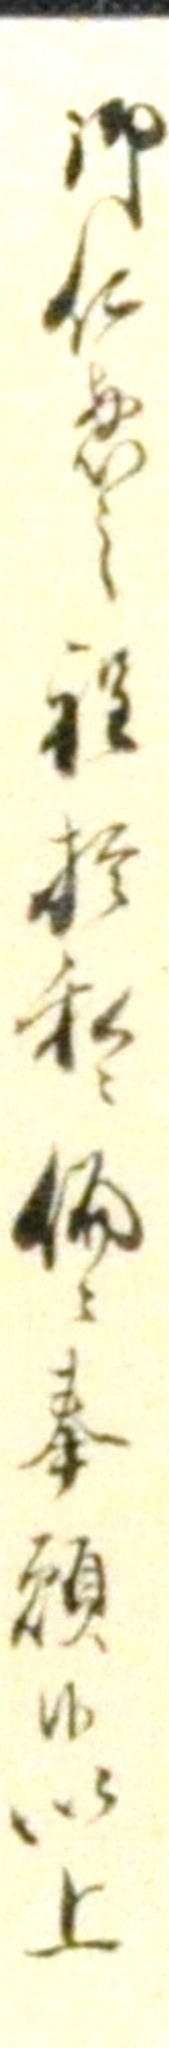御仁恵之程於私に偏に奉願候以上
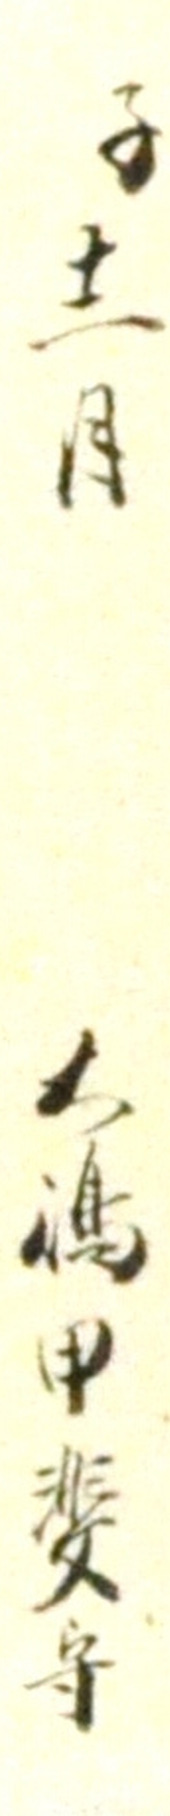子十二月大島甲斐守

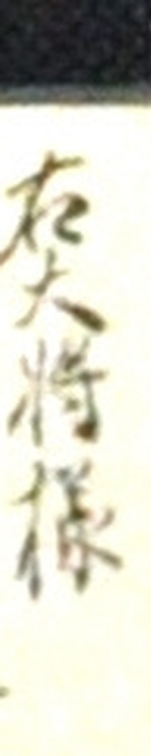右大将様
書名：右大将様御書院番御用人見込書付
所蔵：伊那市立高遠町図書館・合同会社AMANE
